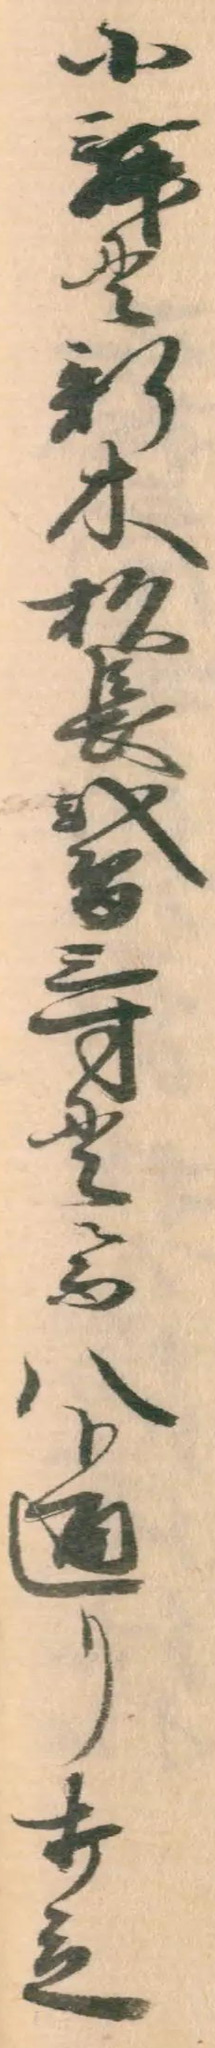小舞貫新木杉長弐間三寸貫に而八分通り打立
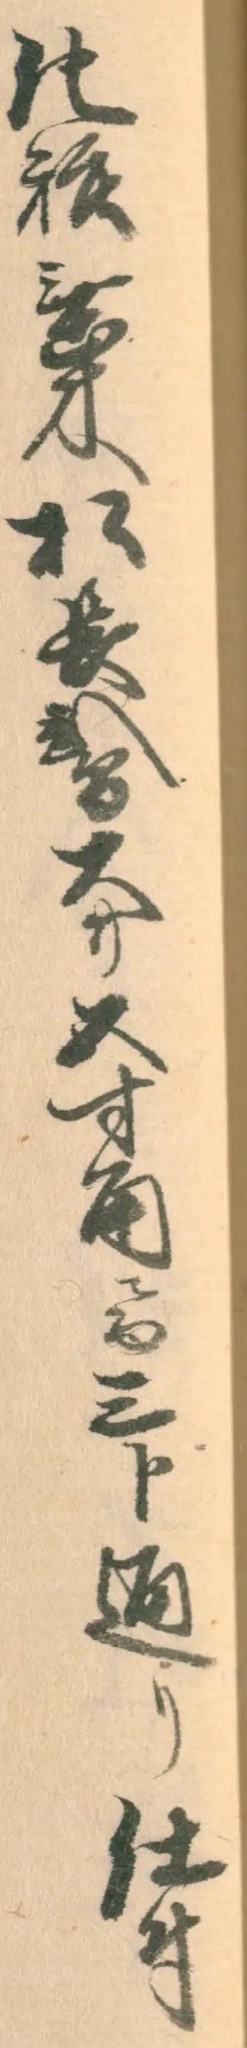化粧垂木松長弐間大さ五寸角に而三分通り仕付
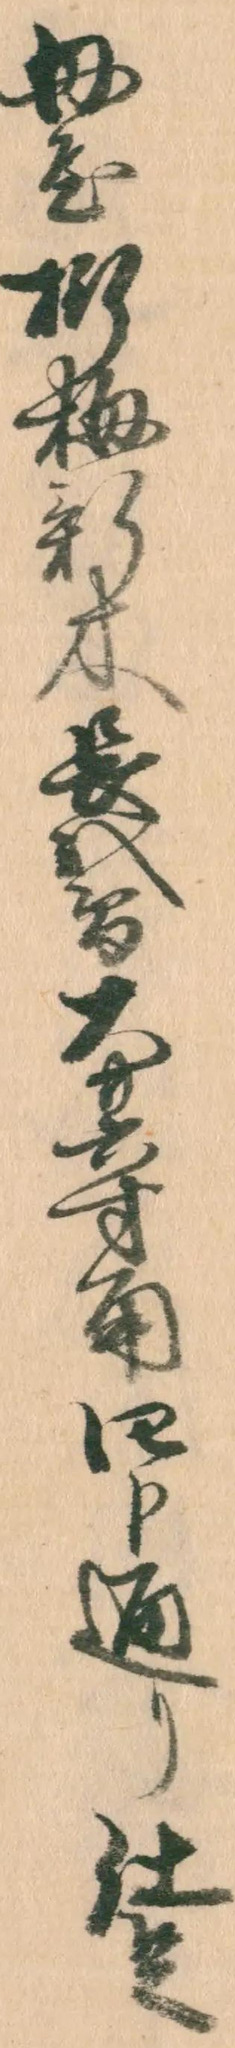母屋桁栂新木長弐間大さ六寸角四分通り仕足
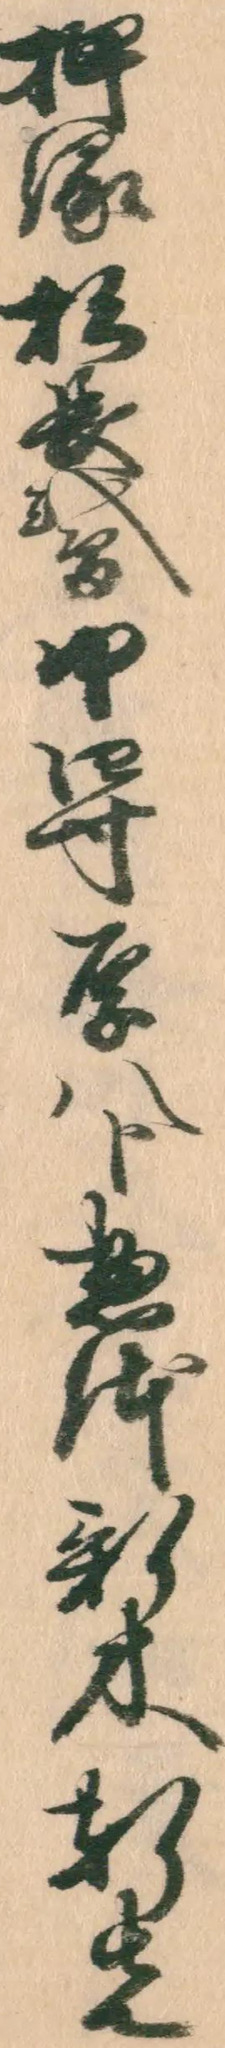押縁松長弐間巾四寸厚八分惣⁀躰新木軒先
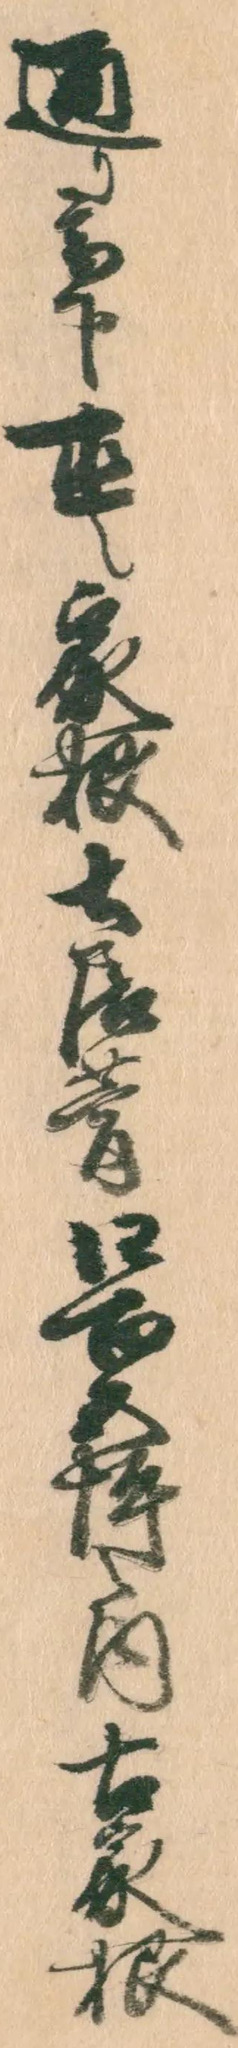通り高下直し家根土居葺四百五坪之内古家根
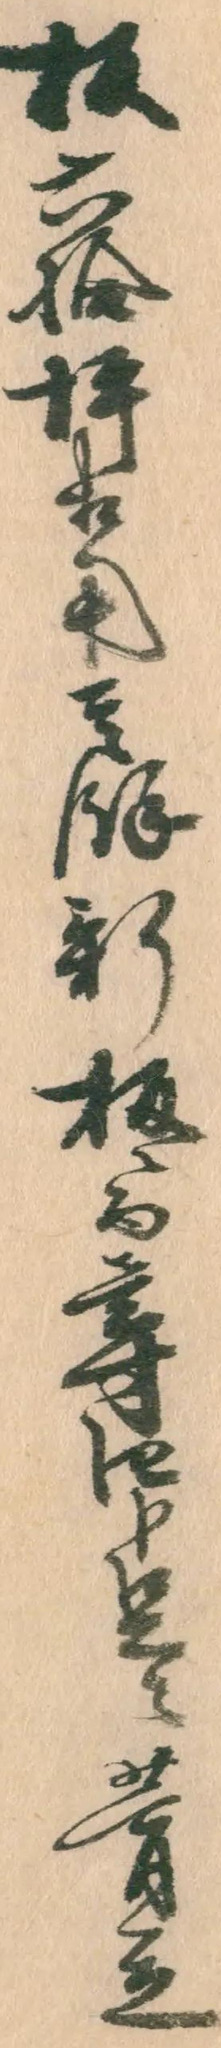板六拾坪相用其餘新板に而壱寸四分足に葺立
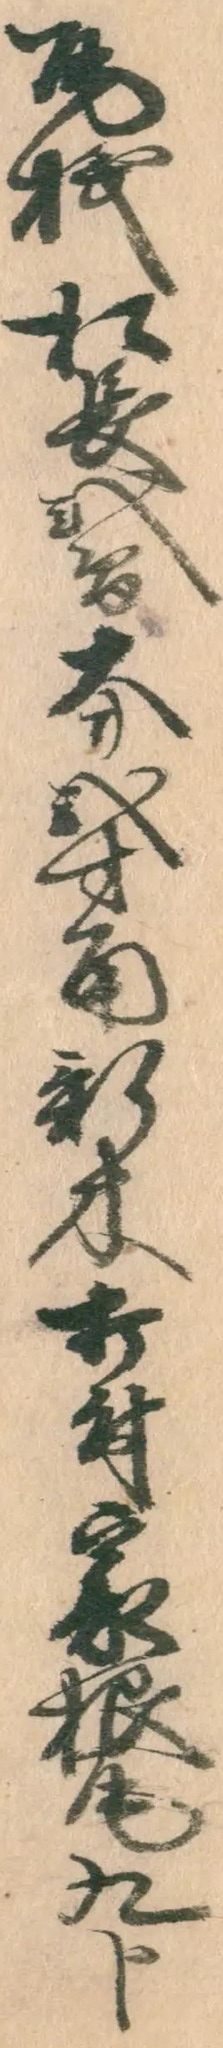瓦桟松長弐間大さ弐寸角新木打付家根瓦九分

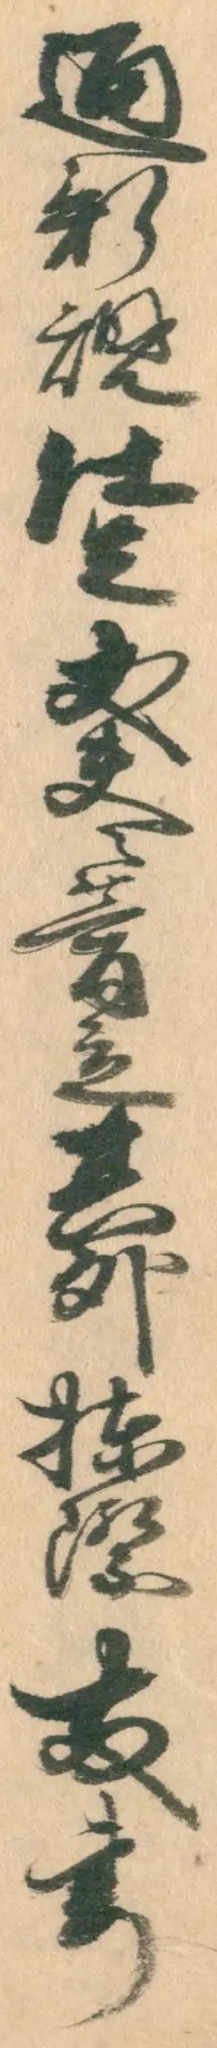通新規仕足丈夫に葺立其外棟際両妻
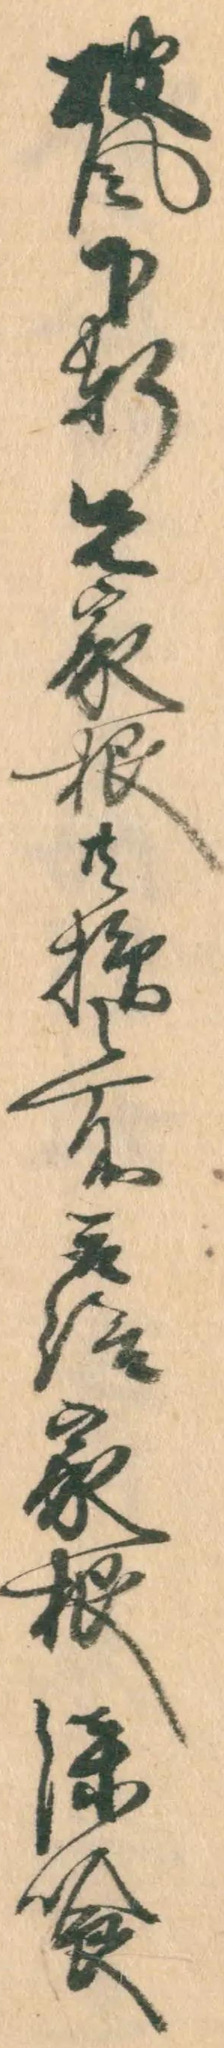破風下軒先家根共損之所取繕家根漆喰
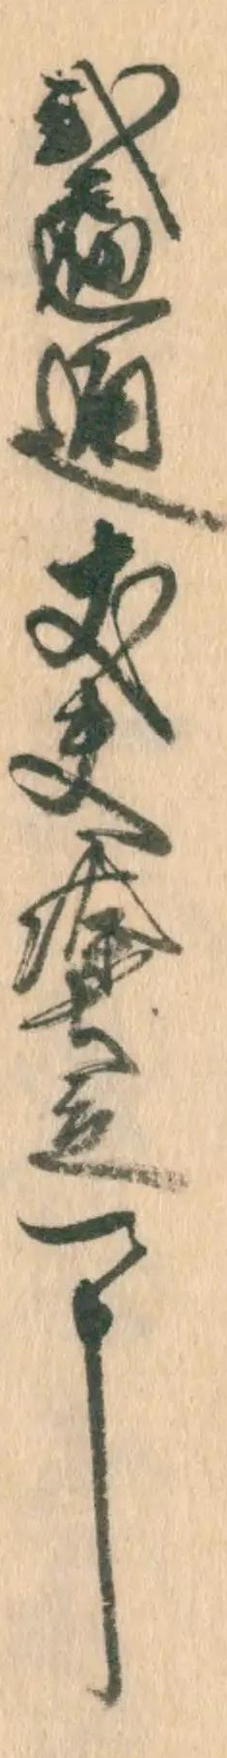弐遍通丈夫塗立可申候
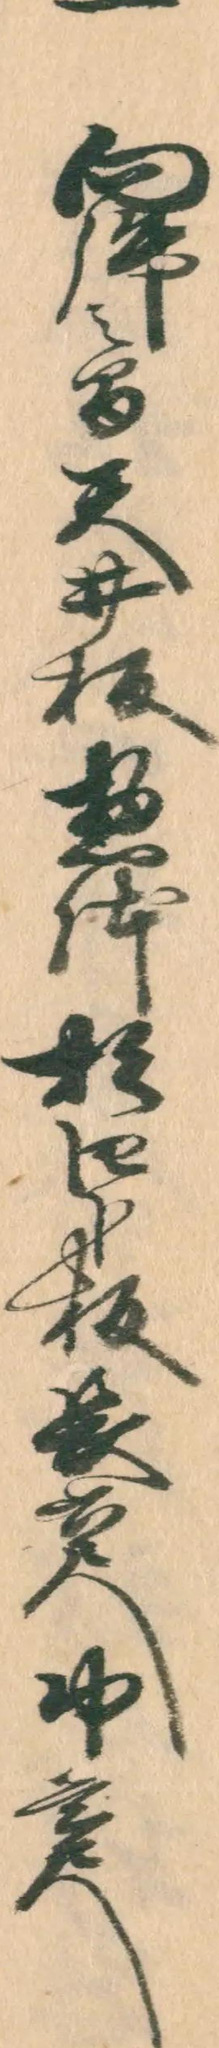一向拝之間天井板惣躰杉四分板長六尺巾壱尺
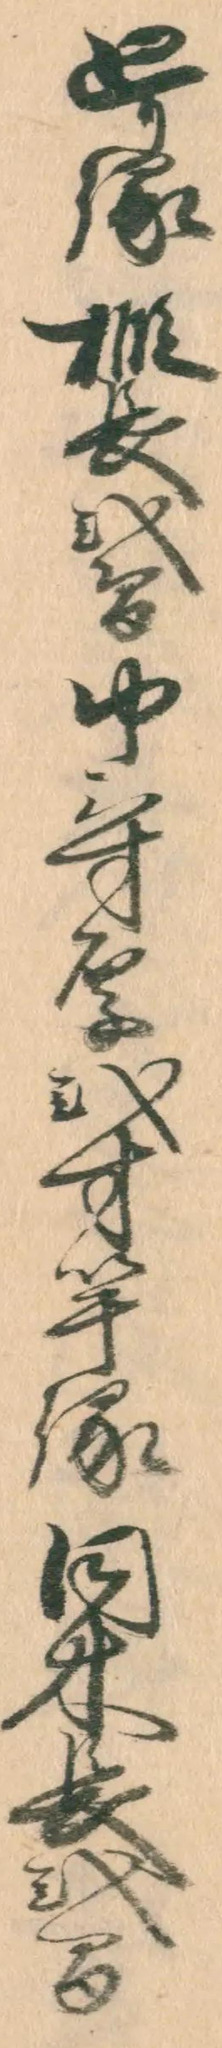廻縁樅長弐間巾三寸厚二寸竿縁同木長弐間
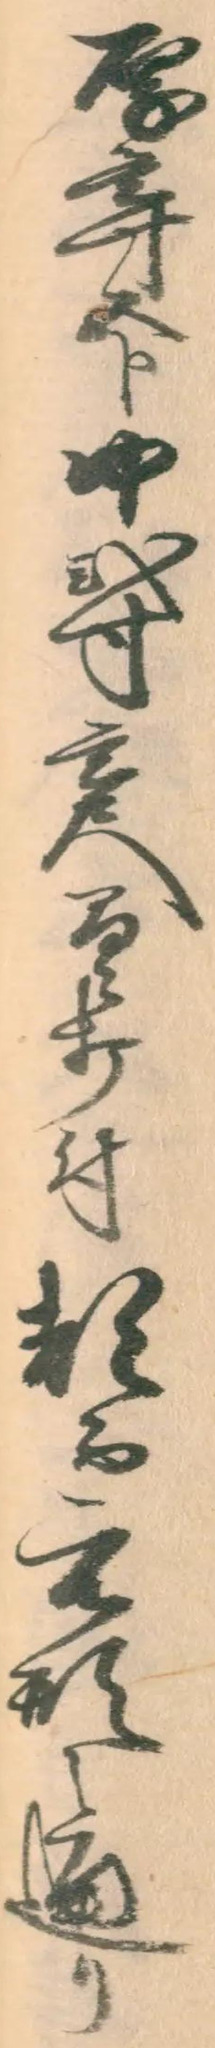厚壱寸五分巾弐寸壱尺間に打付都而元形之通り
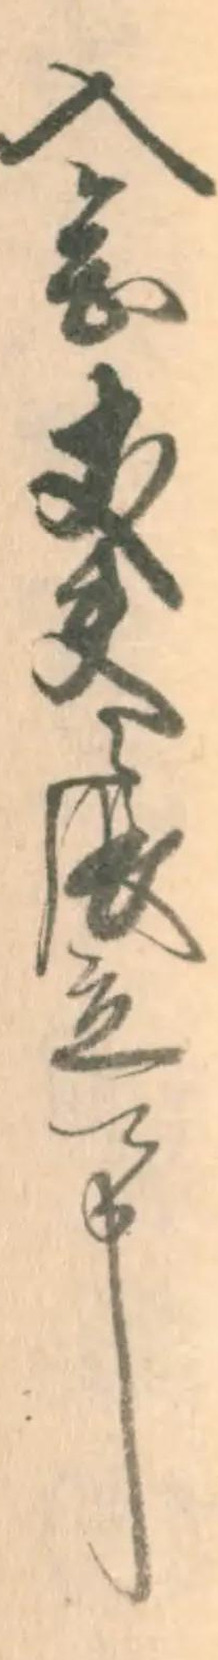入念丈夫に張立可申候
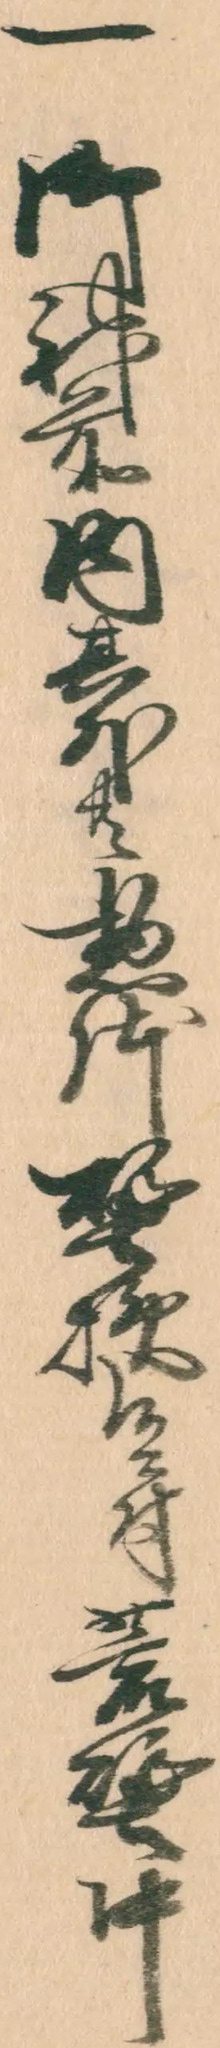一御神前内其外共惣体壁損候に付荒壁中
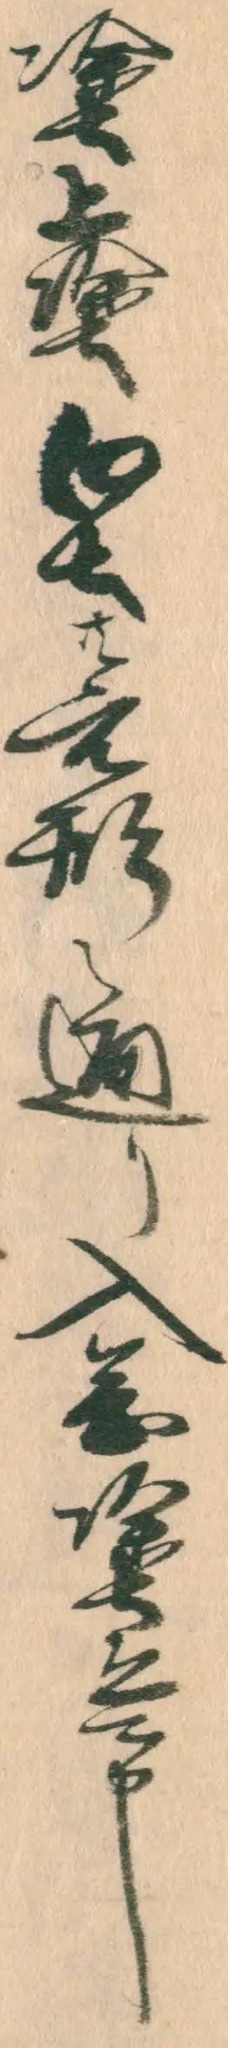塗上塗白土共元形之通り入念塗立可申候
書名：三十三間堂. [1]
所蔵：国立国会図書館 National Diet Library, JAPAN
